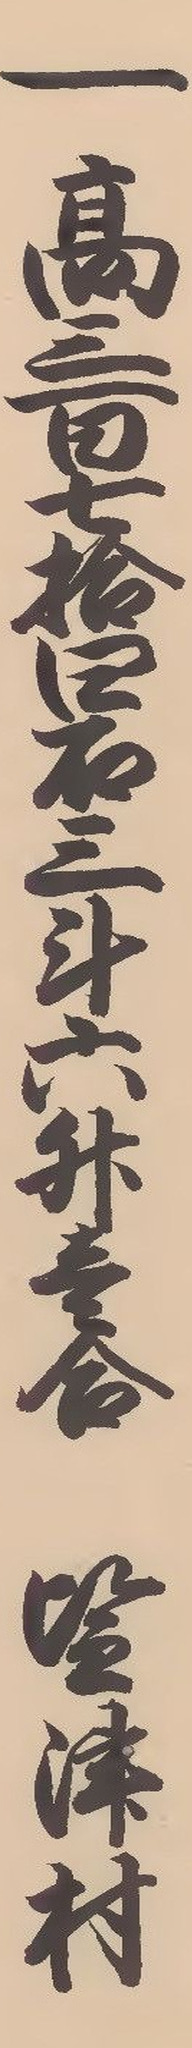一高三百七拾四石三斗六升壱合塩津村
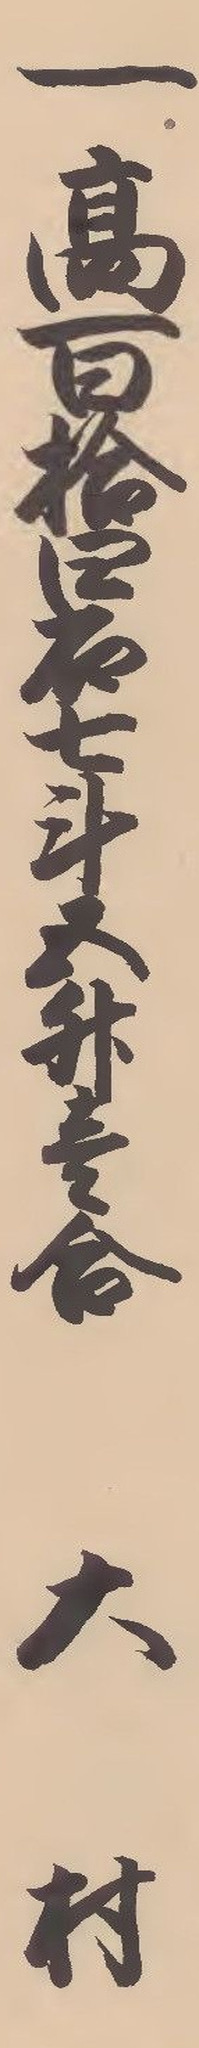一高百拾四石七斗五升壱合大村
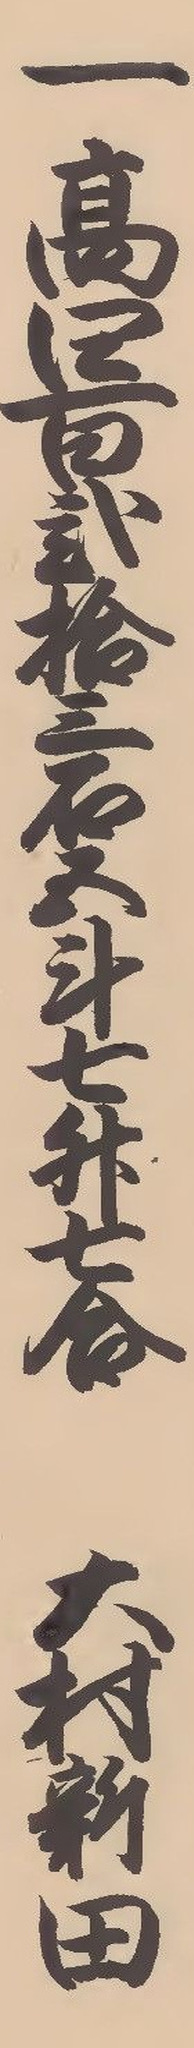一高四百弐拾三石五斗七升七合大村新田
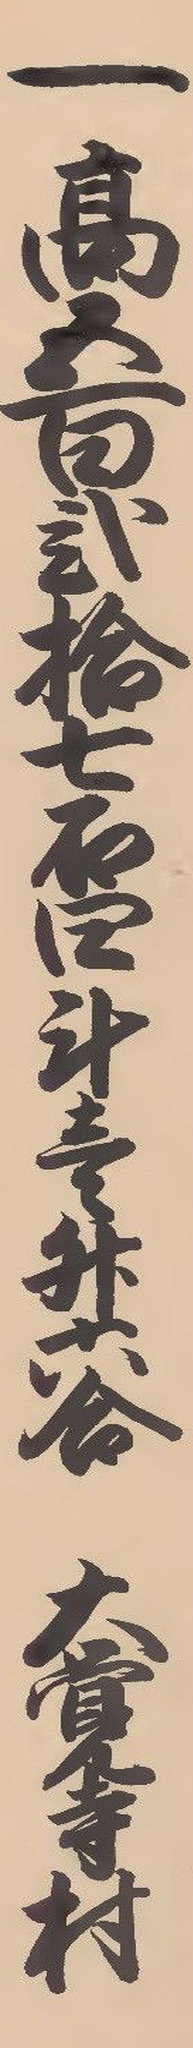一高五百弐拾七石四斗壱升六合大覚寺村
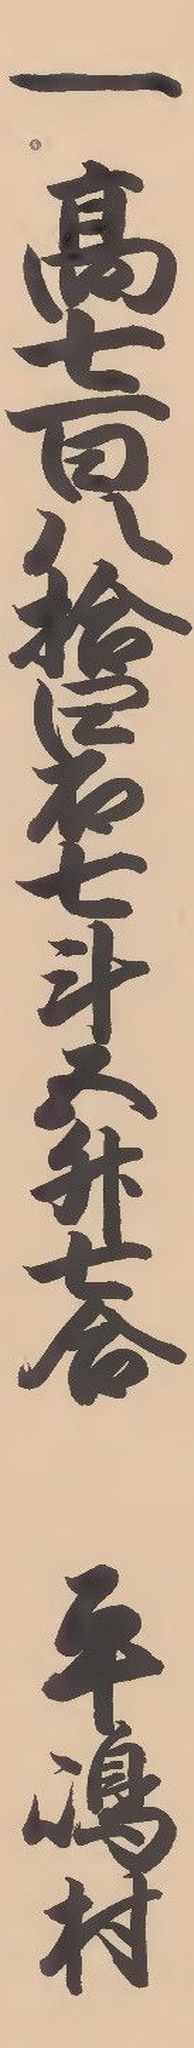一高七百八拾四石七斗五升七合平島村
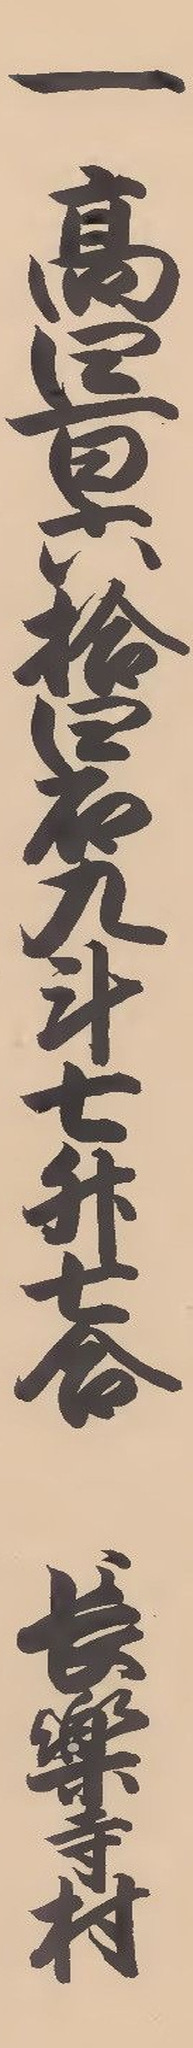一高四百六拾四石九斗七升七合長楽寺村
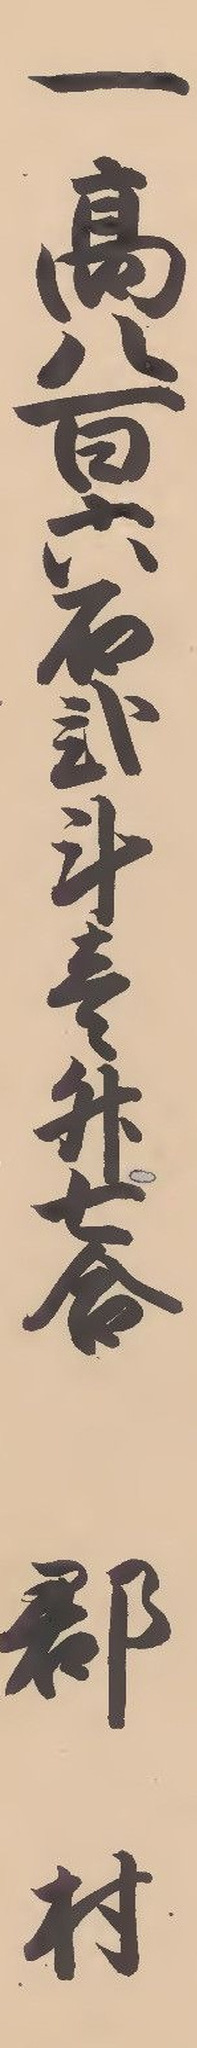一高八百六石弐斗壱升七合郡村

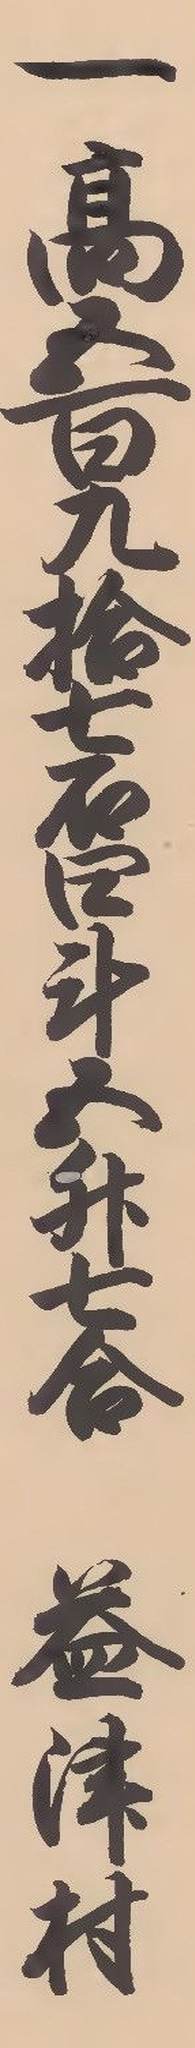一高五百九拾七石四斗五升七合益津村
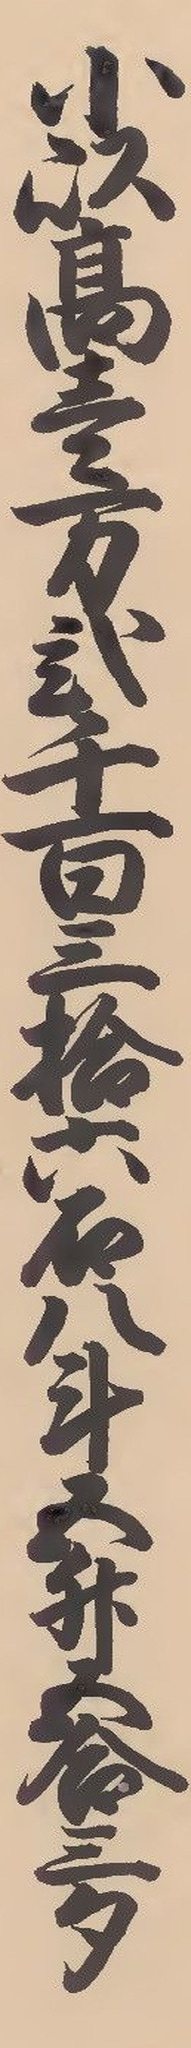小以高壱万弐千百三拾六石八斗五升五合三勺
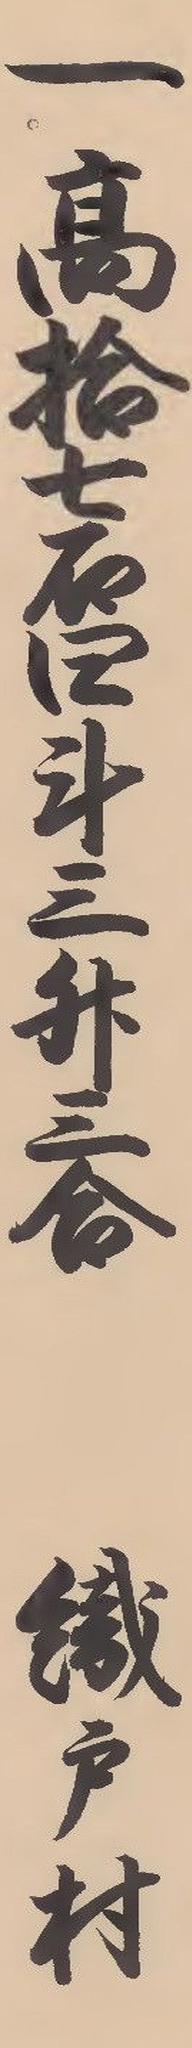一高拾七石四斗三升三合織戸村
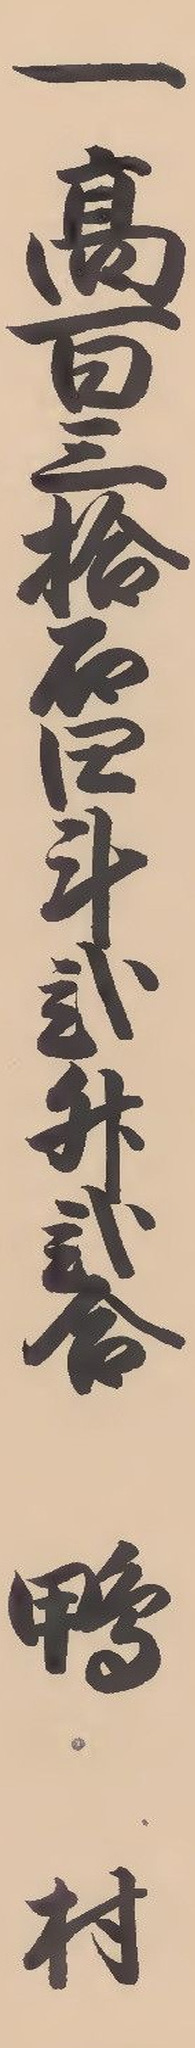一高百三拾石四斗弐升弐合鴨村
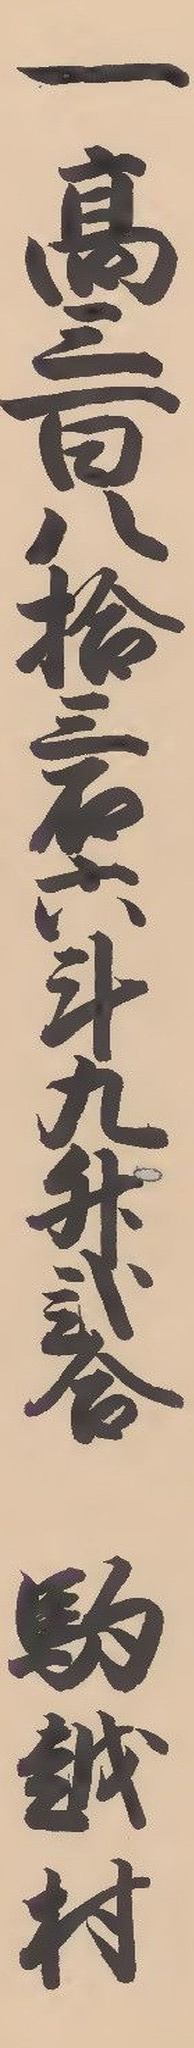一高三百八拾三石六斗九升弐合駒越村

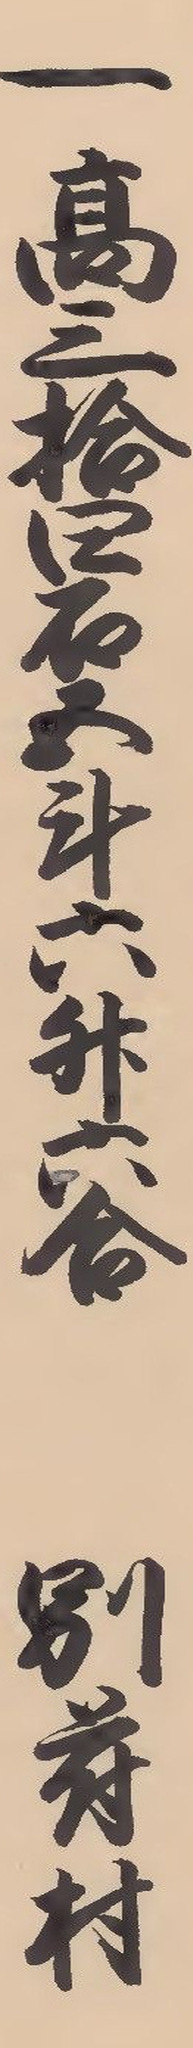一高三拾四石五斗六升六合別苻村
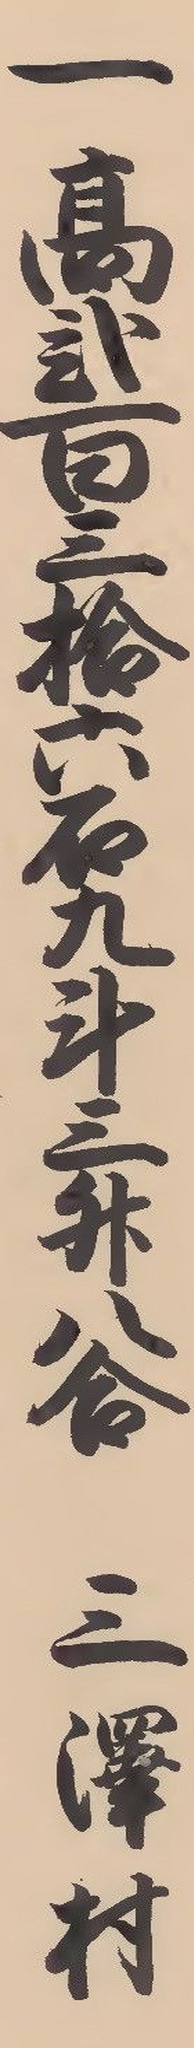一高弐百三拾六石九斗三升八合三沢村
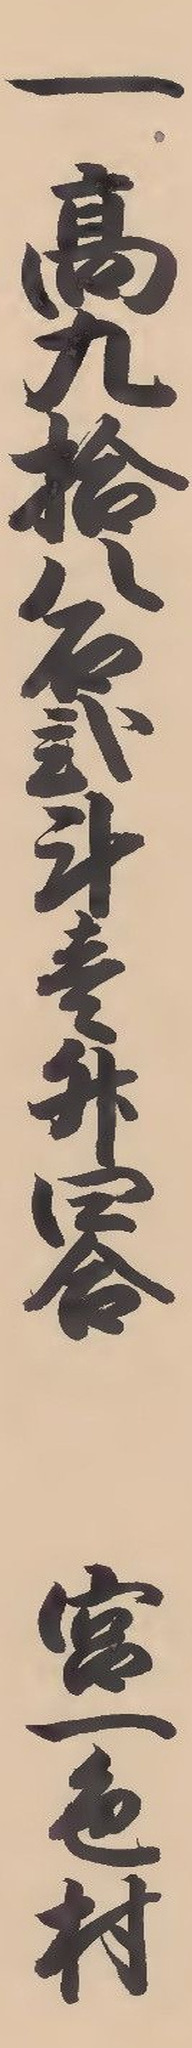一高九拾八石弐斗壱升四合宮一色村
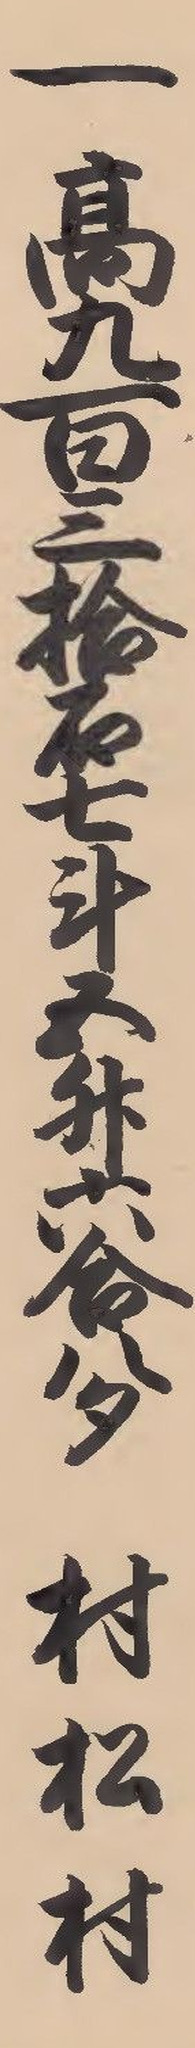一高九百三拾石七斗五升六合八勺村松村
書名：駿河国郷帳
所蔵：国立公文書館 National Archives of Japan
